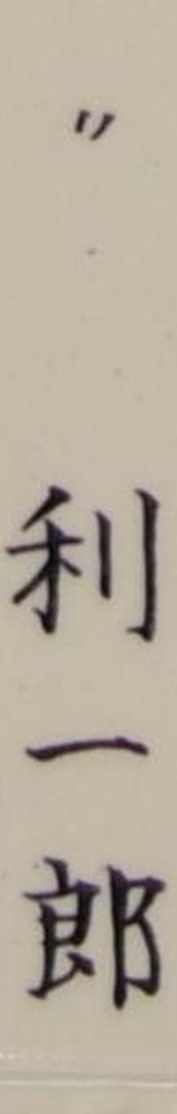利一郎
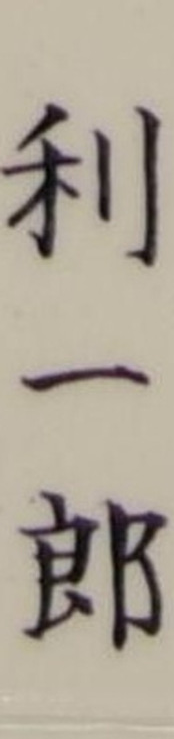利一郎
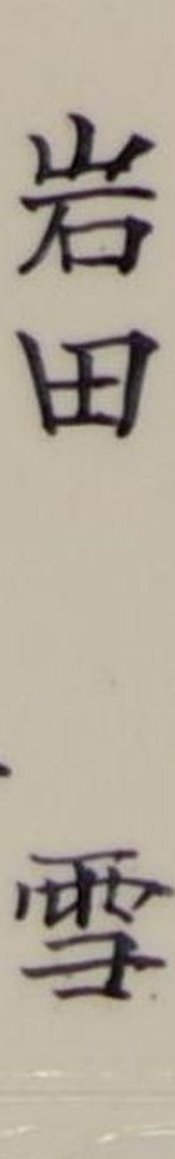岩田雪

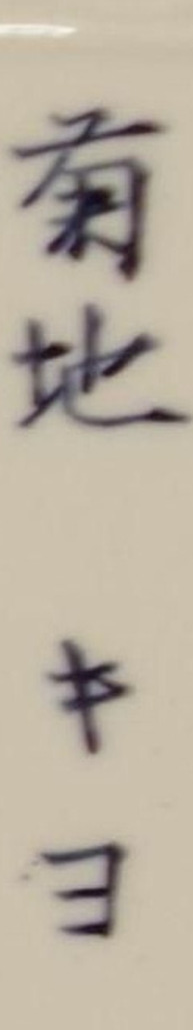菊地キヨ
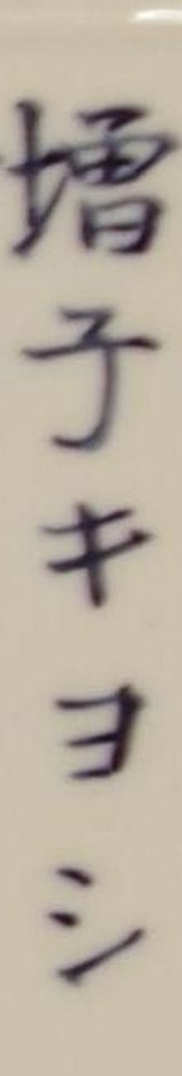増子キヨシ
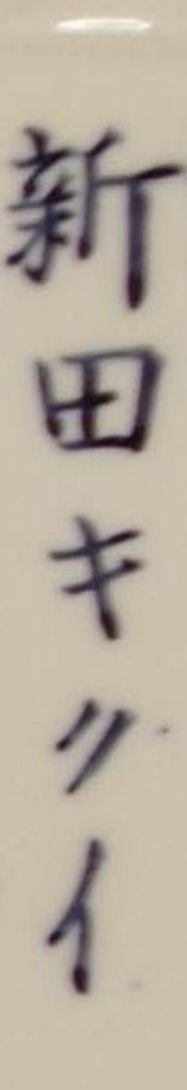新田キクイ
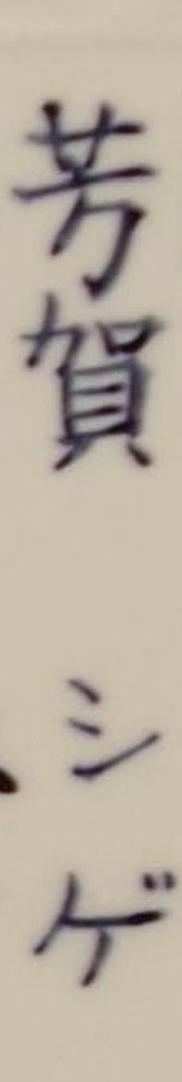芳賀シゲ
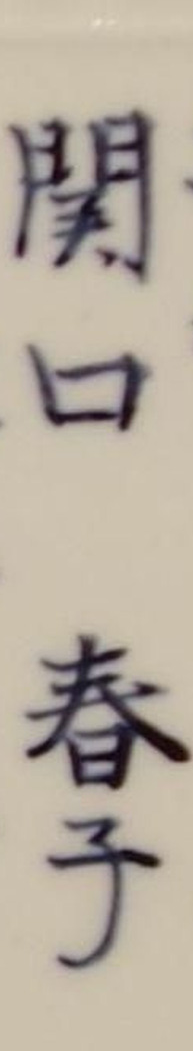関口春子
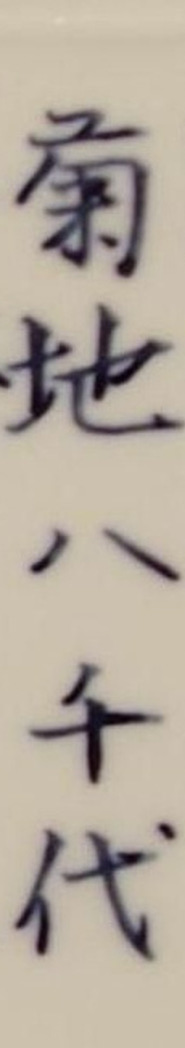菊地八千代
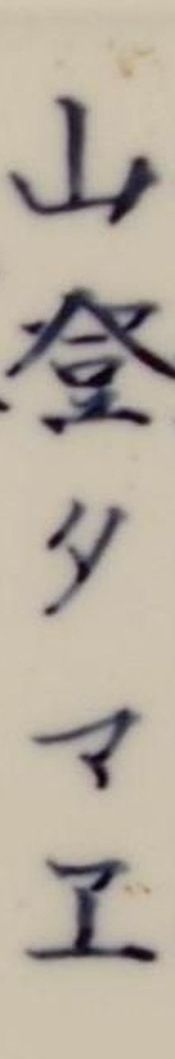山登タマエ
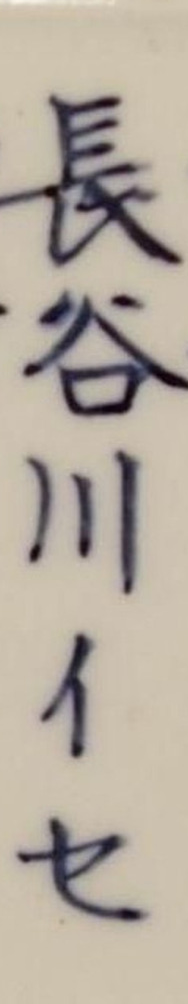長谷川イセ
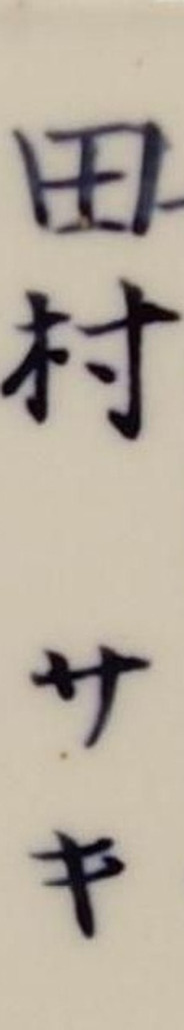田村サキ
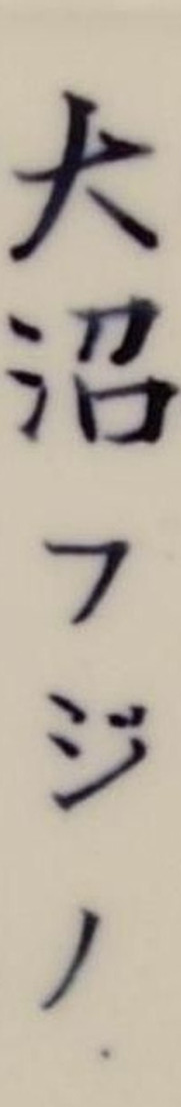大沼フジノ
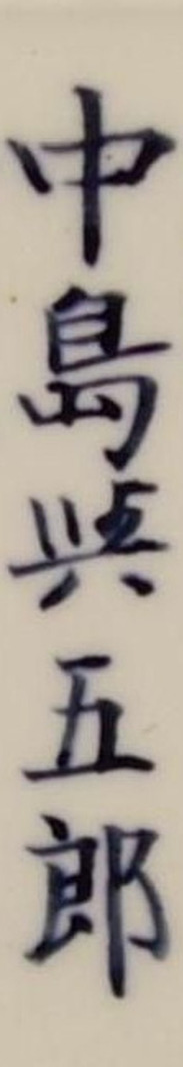中島与五郎
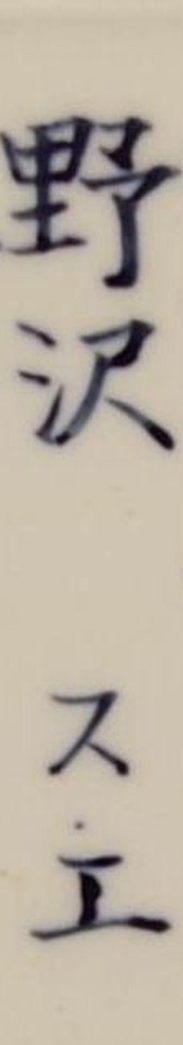野沢スエ
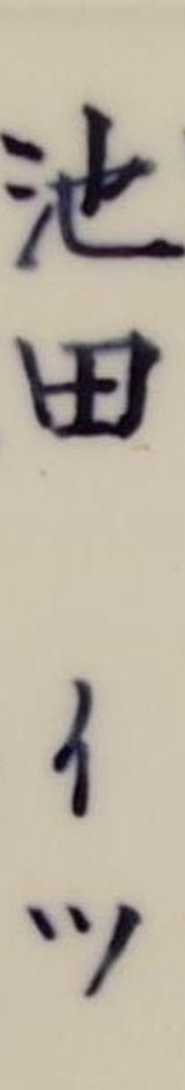池田イツ
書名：M~S
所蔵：高野山金剛峯寺
